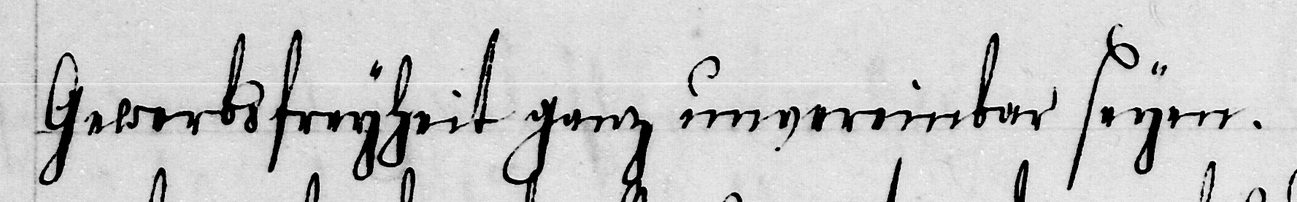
Gewerbsfreyheit ganz unvereinbar seyen.
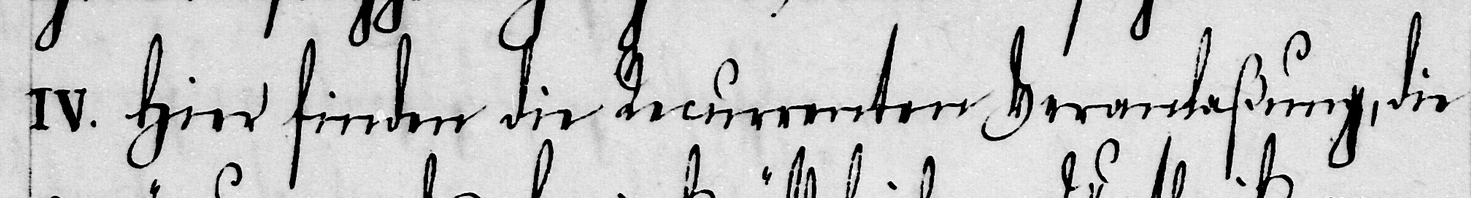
IV. Hier finden die Recurrenten Veranlaßung, die
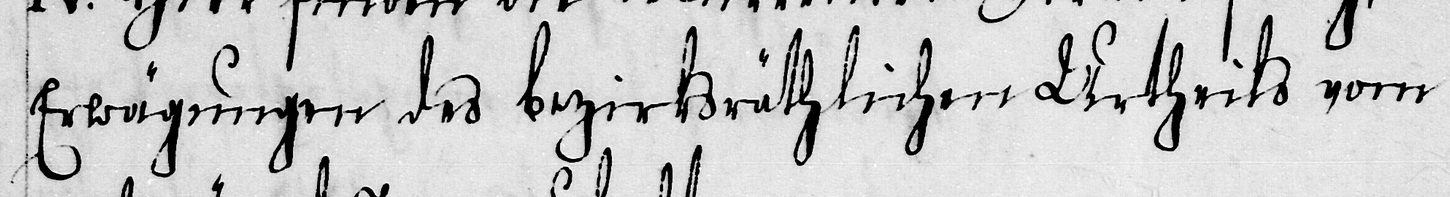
Erwägungen des bezirksräthlichen Urtheils vom
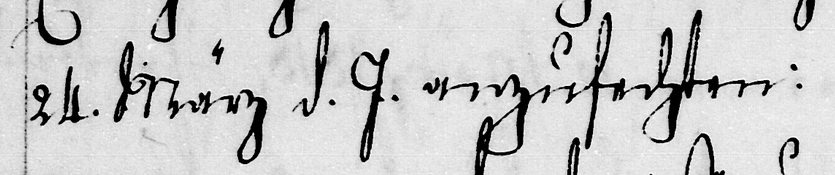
24. März d. J. anzufechten:
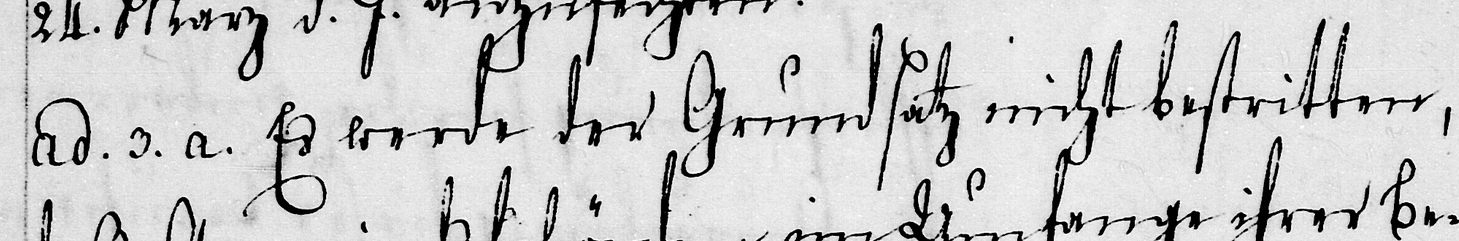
ad. 3. a. Es werde der Grundsatz nicht bestritten,
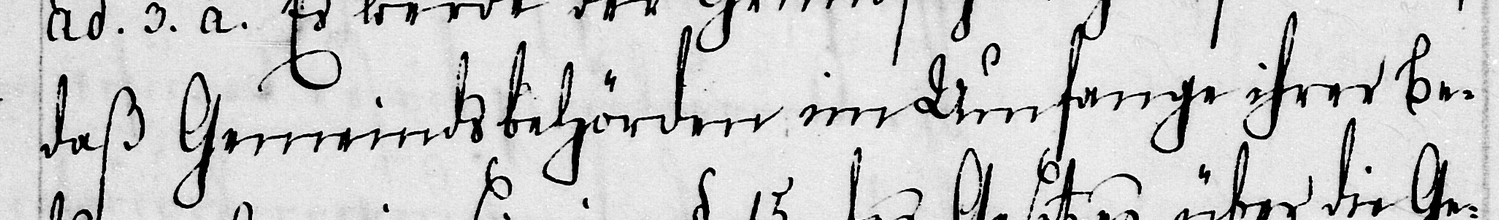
daß Gemeindsbehörden im Umfange ihrer Be¬
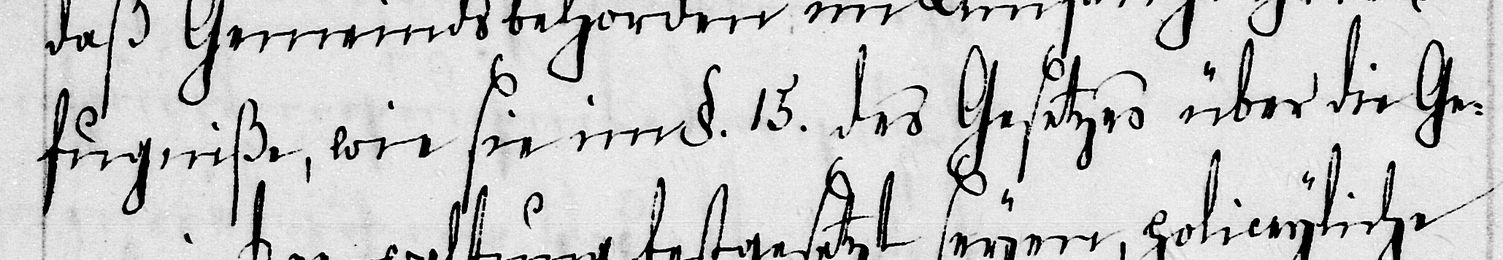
fugniße, wie sie im §. 15. des Gesetzes über die Ge¬
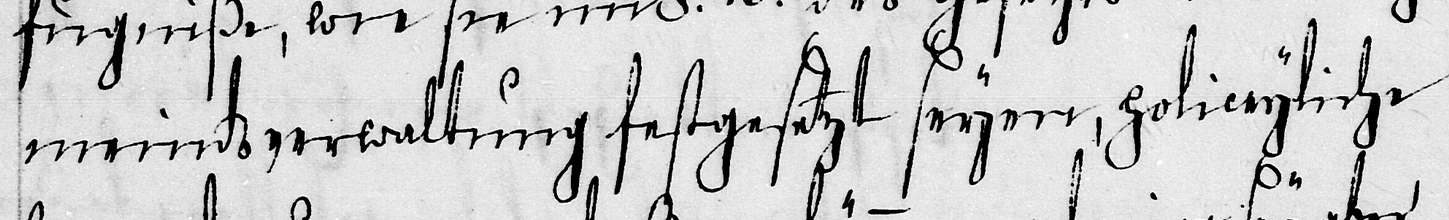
meindsverwaltung festgesetzt seyen, policeyliche
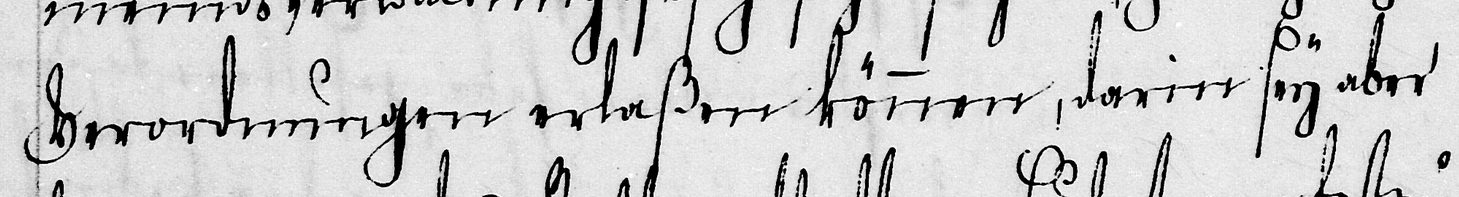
Verordnungen erlaßen können, darin sey aber
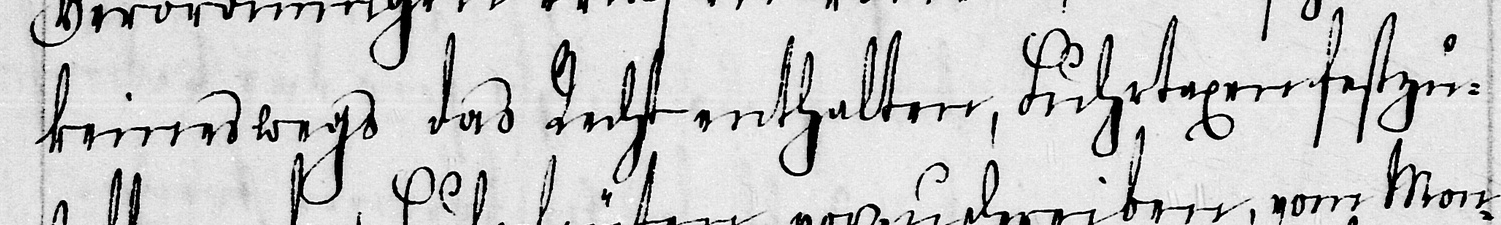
keineswegs das Recht enthalten, Fuhrtaxen festzu¬
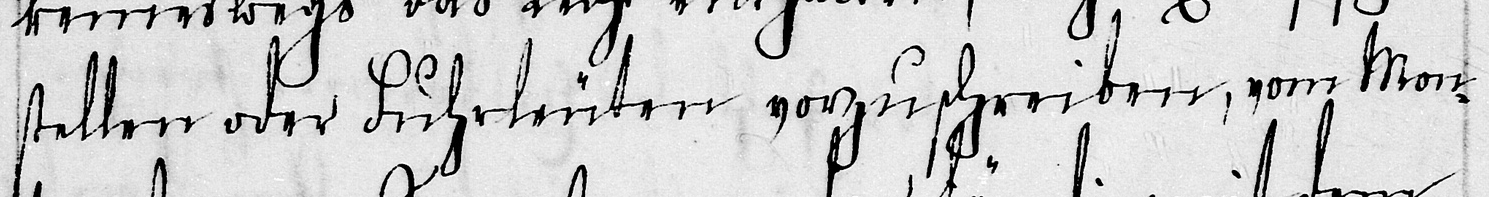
stellen oder Fuhrleuten vorzuschreiben, vom Mon¬
